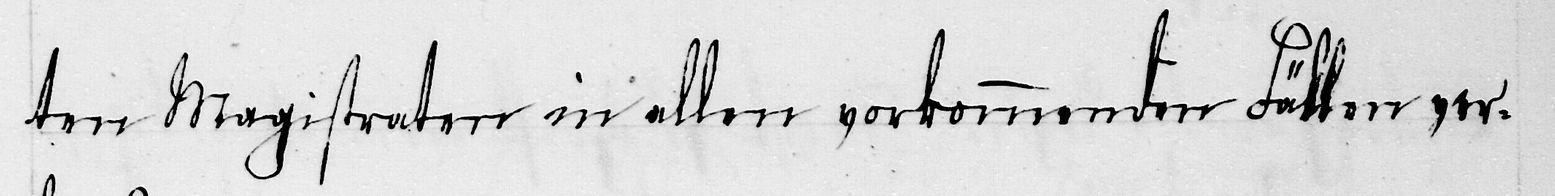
ten Magistraten in allen vorkommenden Fällen ver¬
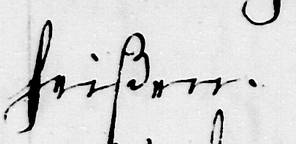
heißen.
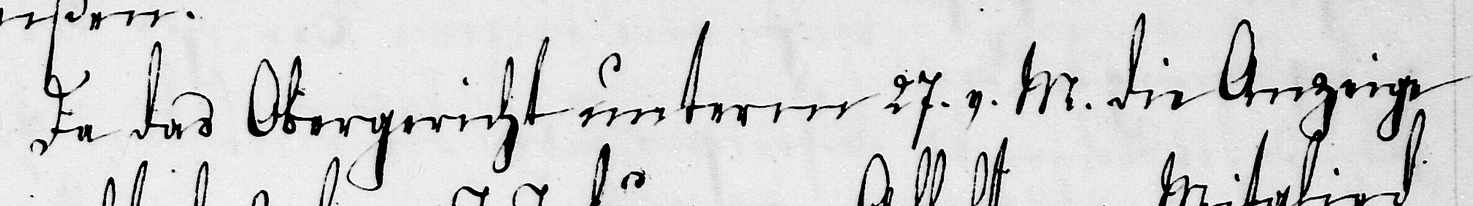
Da das Obergericht unterm 27. v. M. die Anzeige
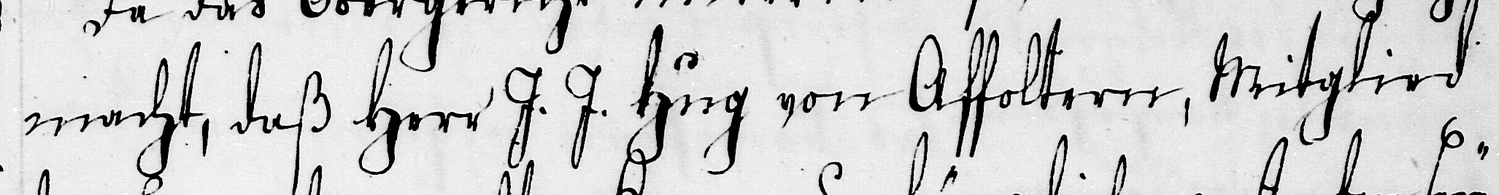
macht, daß Herr J. J. Hug von Affoltern, Mitglied
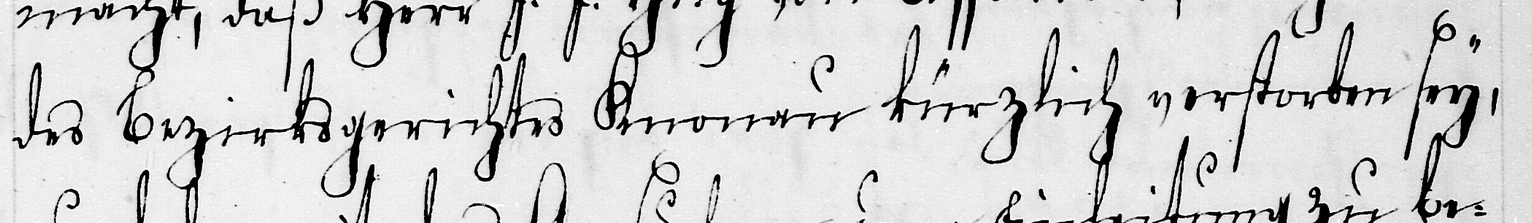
des Bezirksgerichtes Knonau kürzlich verstorben sey,
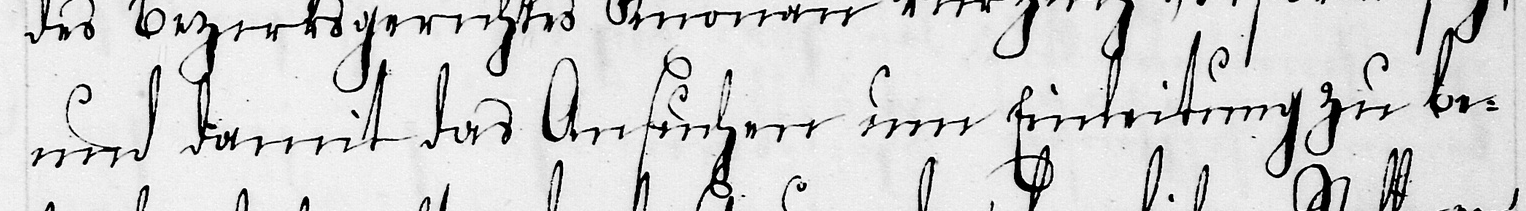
und damit das Ansuchen um Einleitung zu be¬
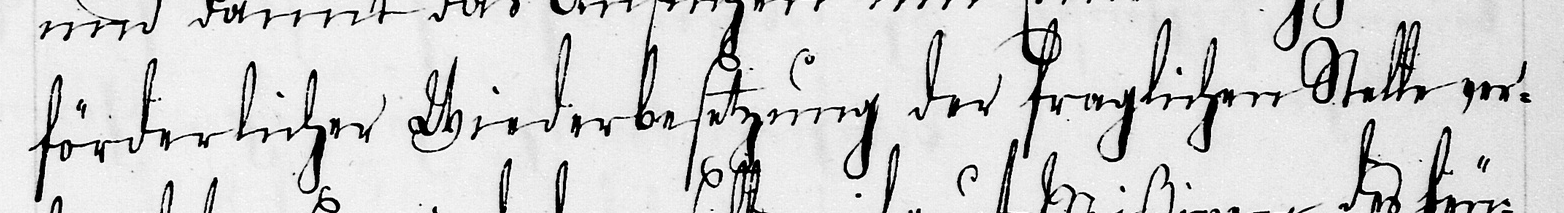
förderlichen Wiederbesetzung der fraglichen Stelle ve¬
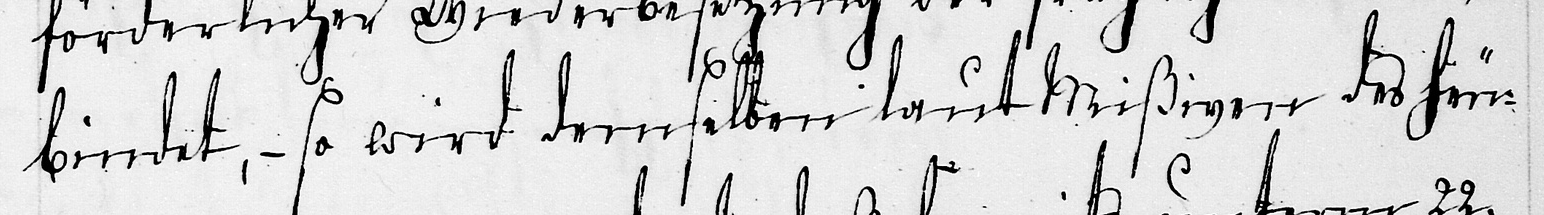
rbindet, – so wird demselben laut Mißiven des heu¬
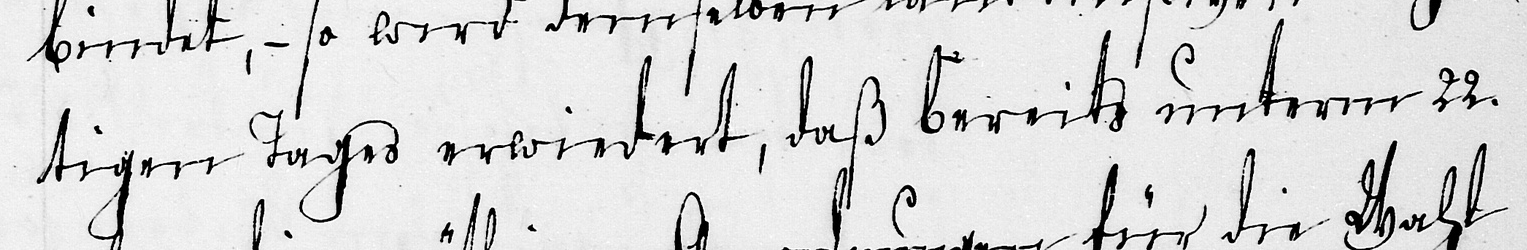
tigen Tages erwiedert, daß bereits unterm 22.
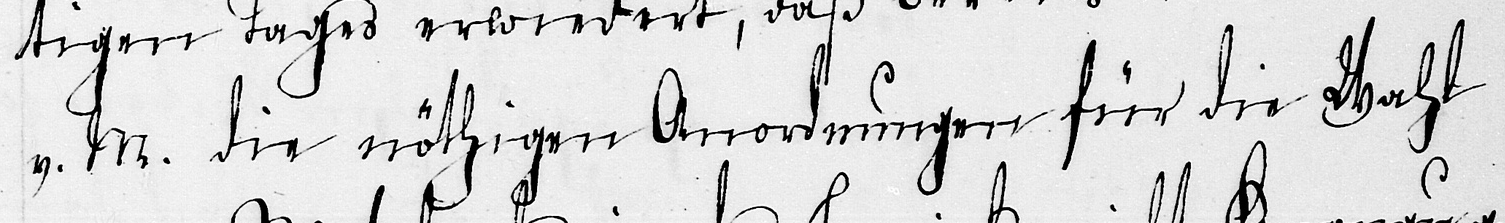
v. M. die nöthigen Anordnungen für die Wahl
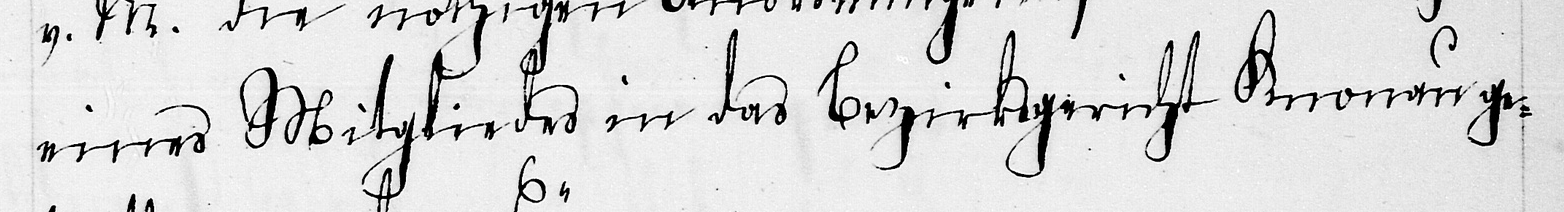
eines Mitgliedes in das Bezirksgericht Knonau ge¬
